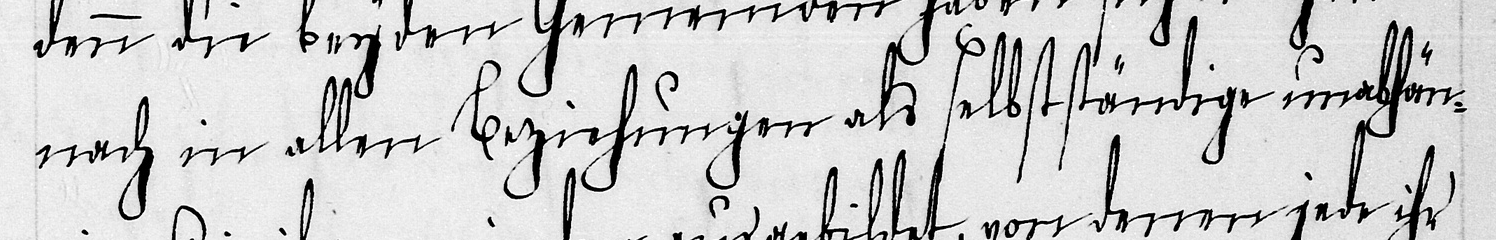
nach in allen Beziehungen als selbstständige unabhän¬
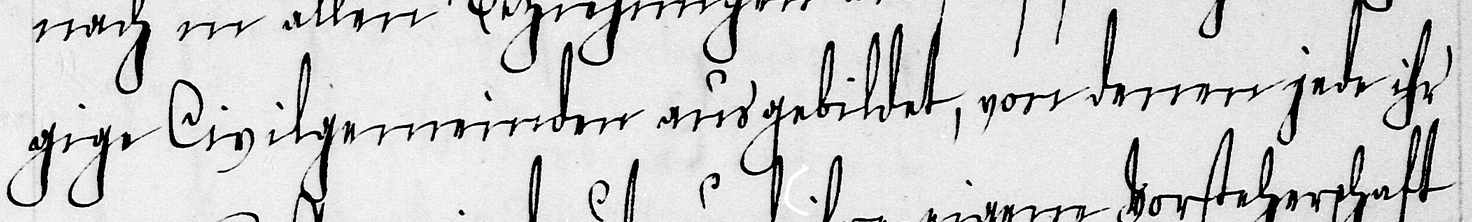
gige Civilgemeinden ausgebildet, von denen jede ihr
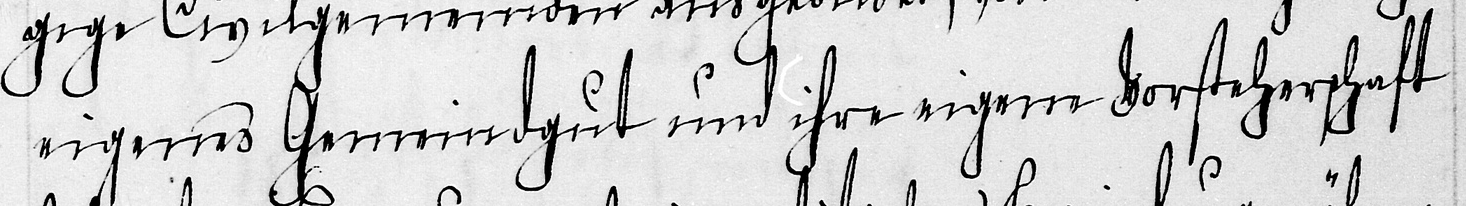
eigenes Gemeindgut und ihre eigene Vorsteherschaft
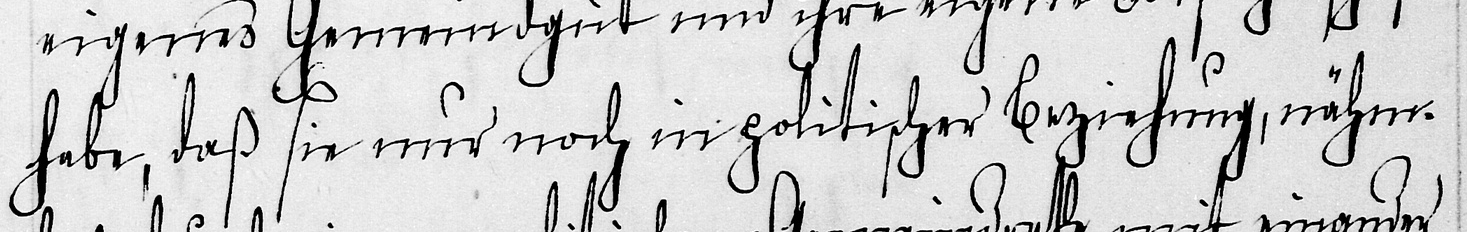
habe, daß sie nur noch in politischer Beziehung, nähm¬
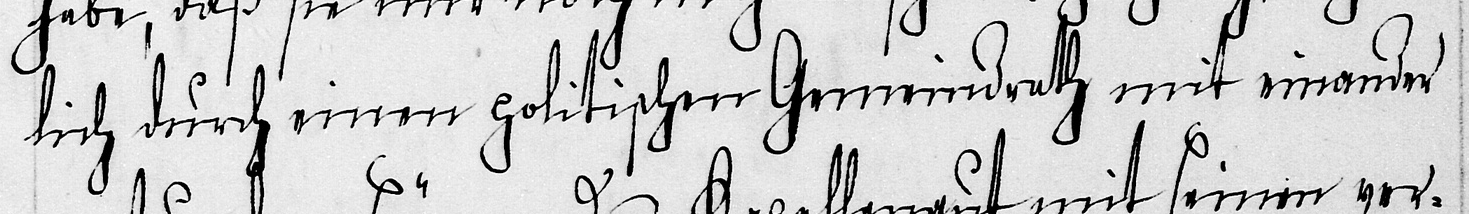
lich durch einen politischen Gemeindrath mit einander
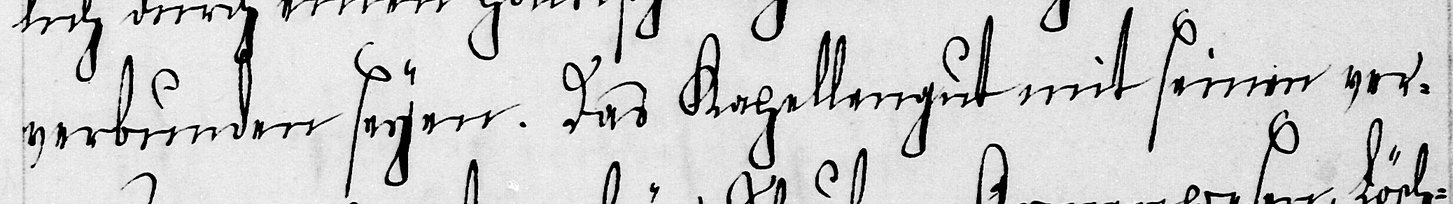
verbunden seyen. Das Kapellengut mit seinen ver¬
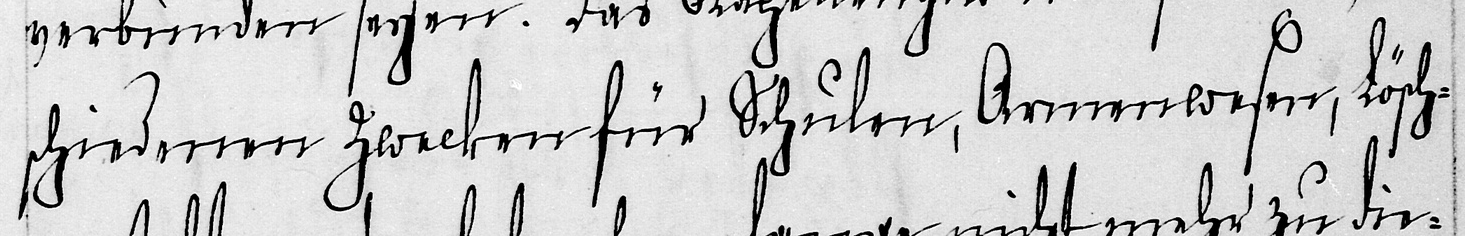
schiedenen Zwecken für Schulen, Armenwesen, Lösc¬
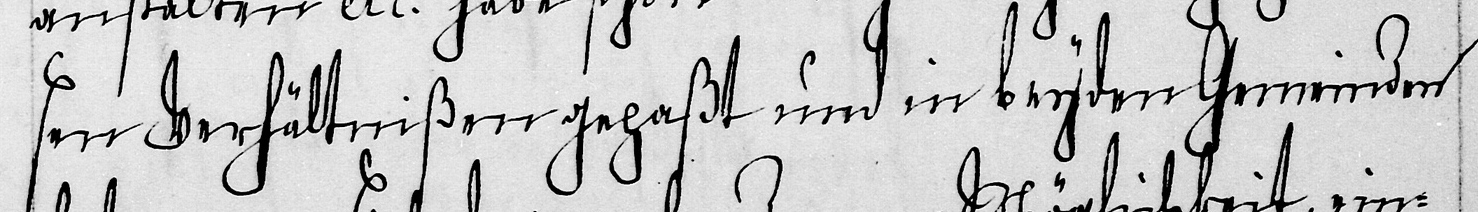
sen Verhältnißen gepaßt und in beyden Gemeinden
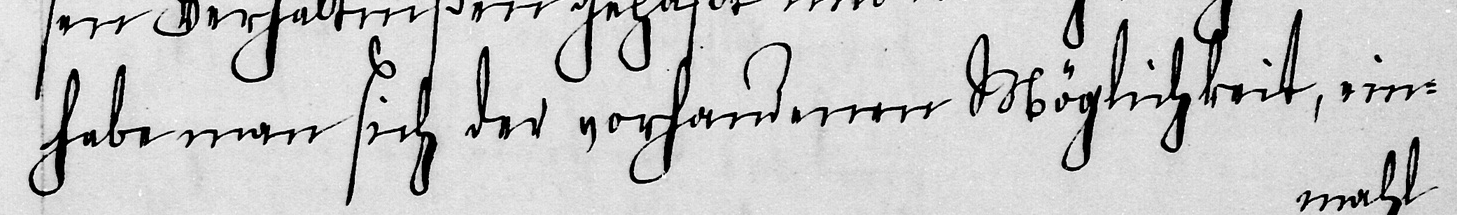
habe man sich der vorhandenen Möglichkeit, ein-
